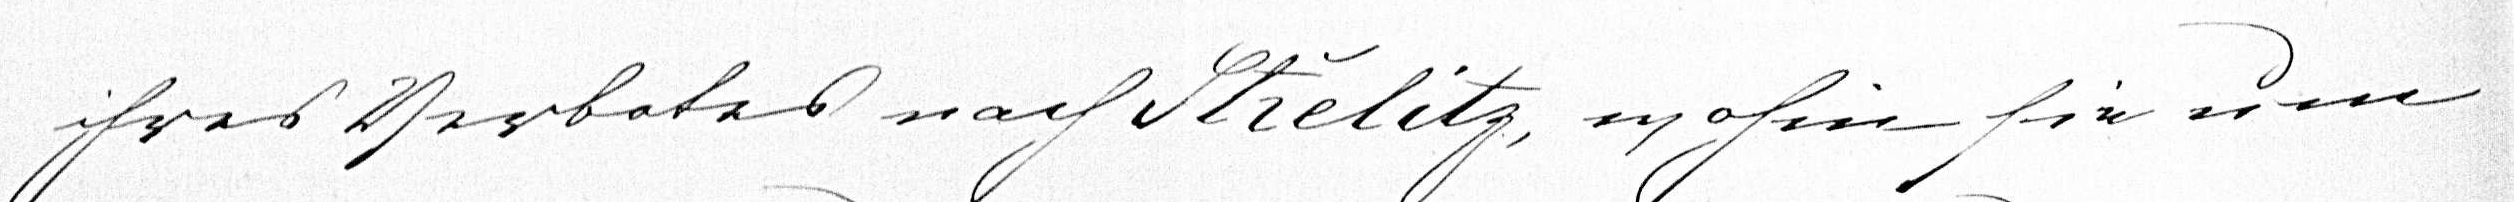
ihres Verbotes nach Stielitz, wohin sie um
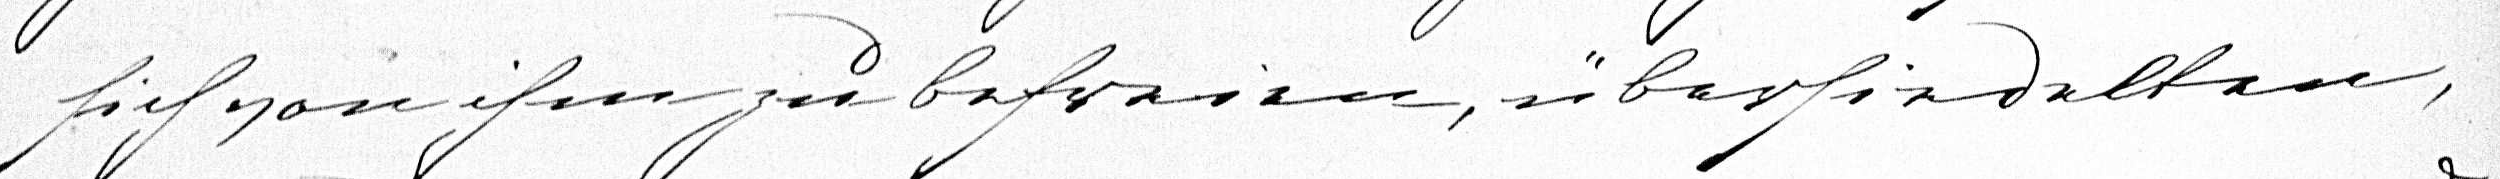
sich von ihm zu befreien, übersiedelten,
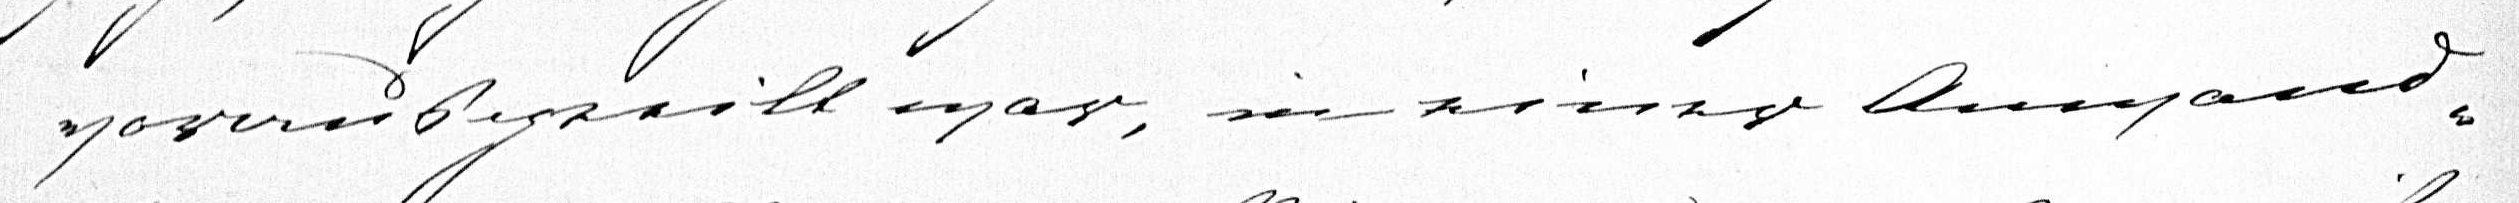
vorausgeeilt war, in einer Anwand¬
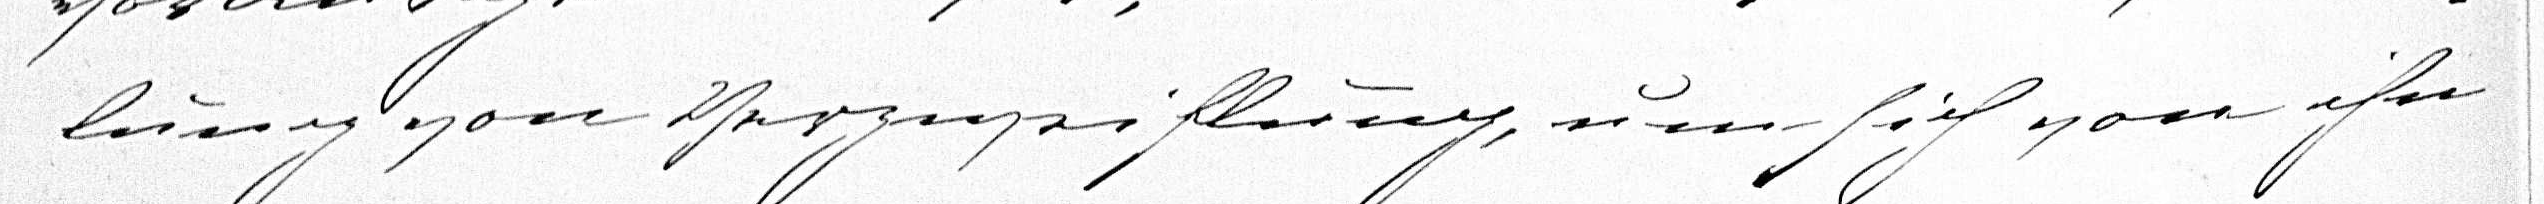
lung von Verzweiflung, um sich von ihn
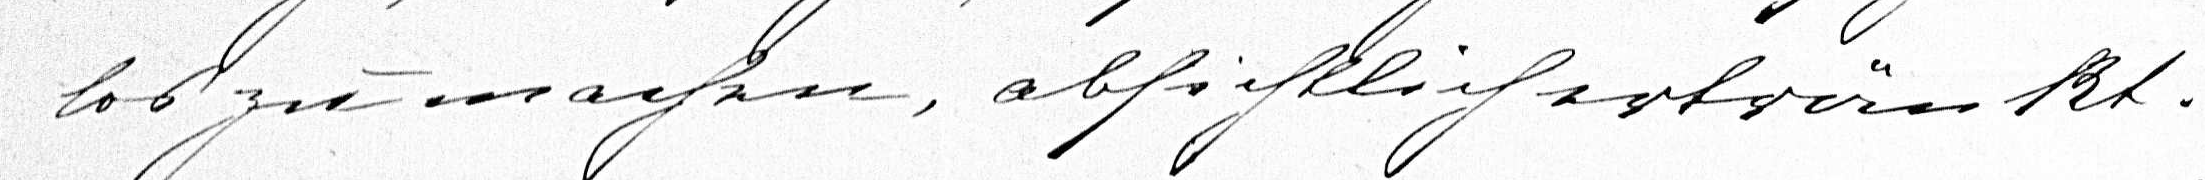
los zu machen, absichtlich ertränkt.
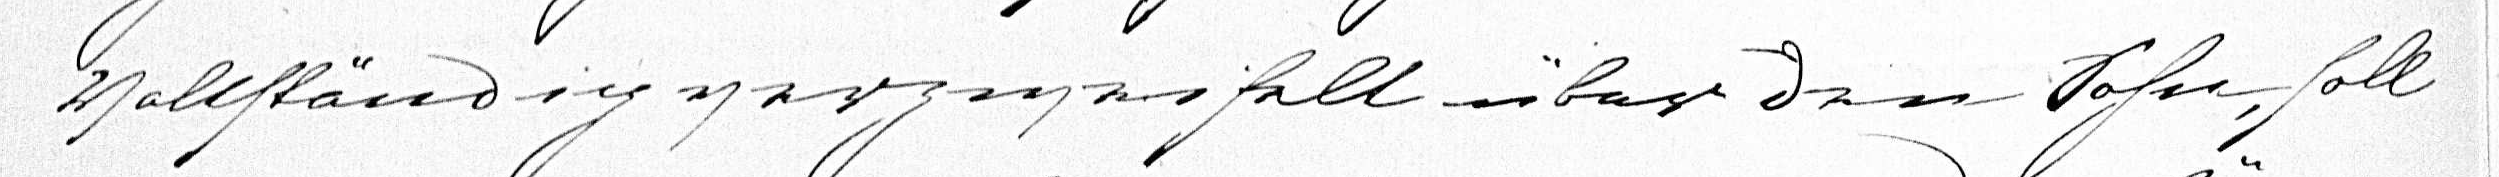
Voltständig verzweifelt, über den Sohn, soll
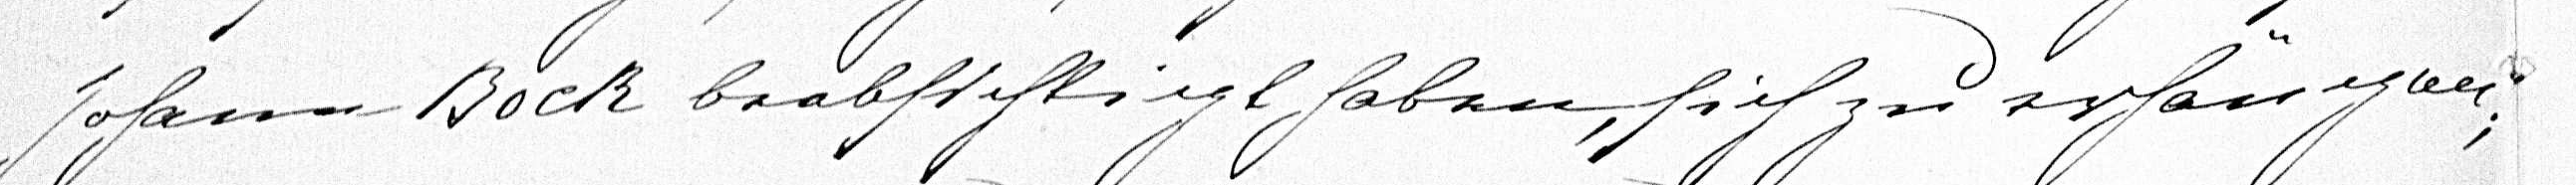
Johann Bock beabsichtigt haben, sich zu erhängen;
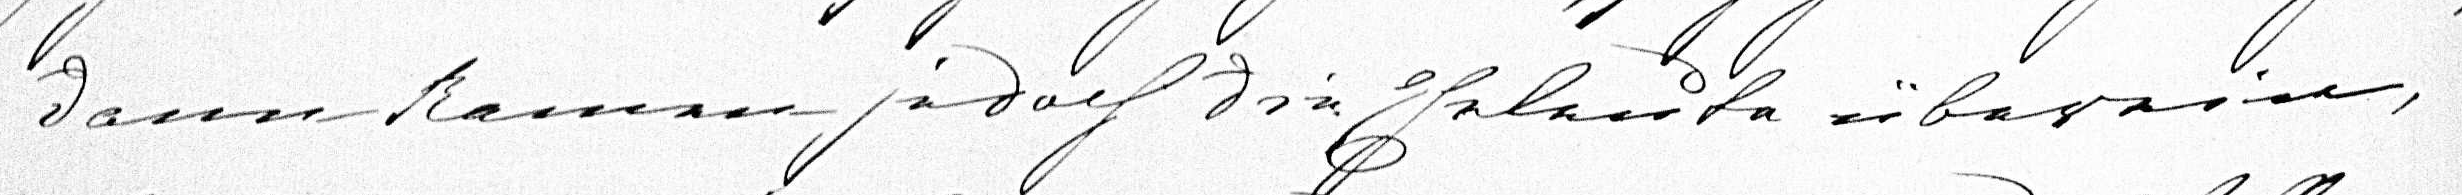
Dann kamen jedoch die Eheleute überein,
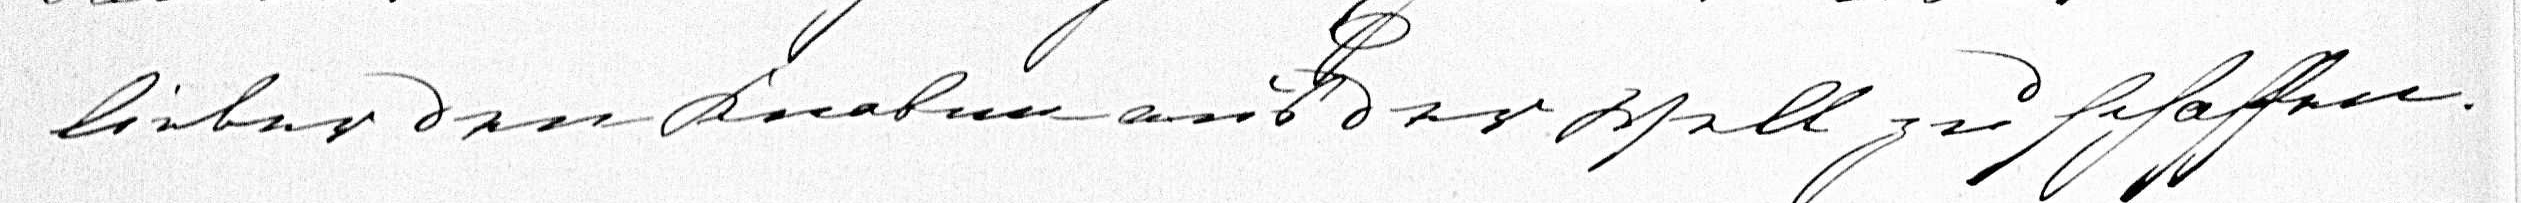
lieber den Knaben aus der Welt zu schassen.
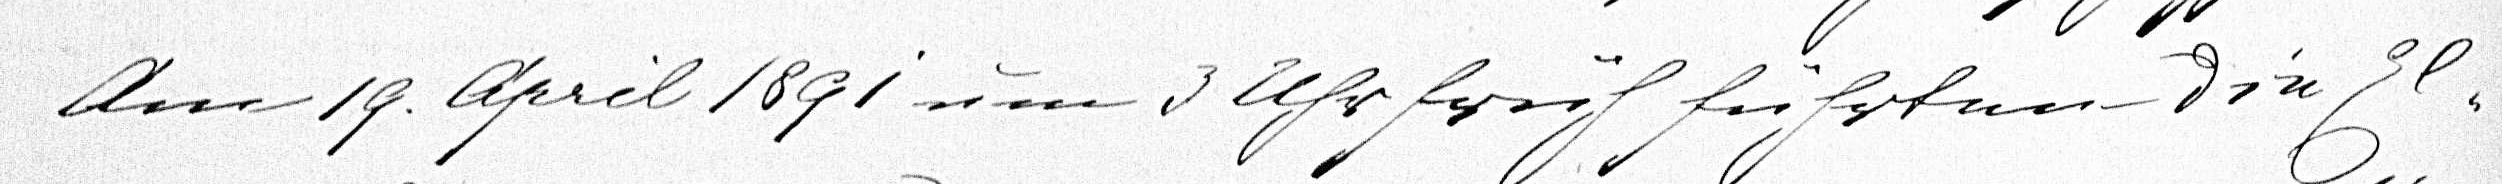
Am 19. April 1891 um 3 Uhr früh führten die El¬
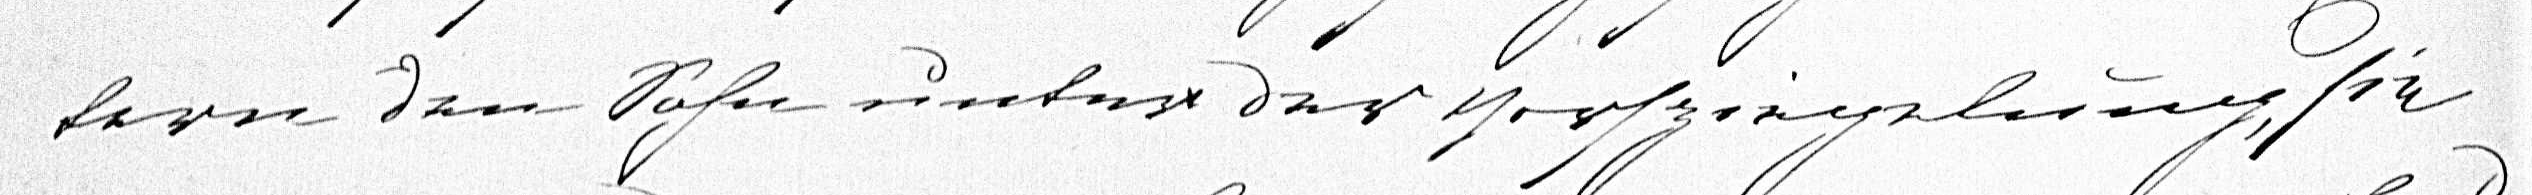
tern den Sohn unter der Versziegelung, sie
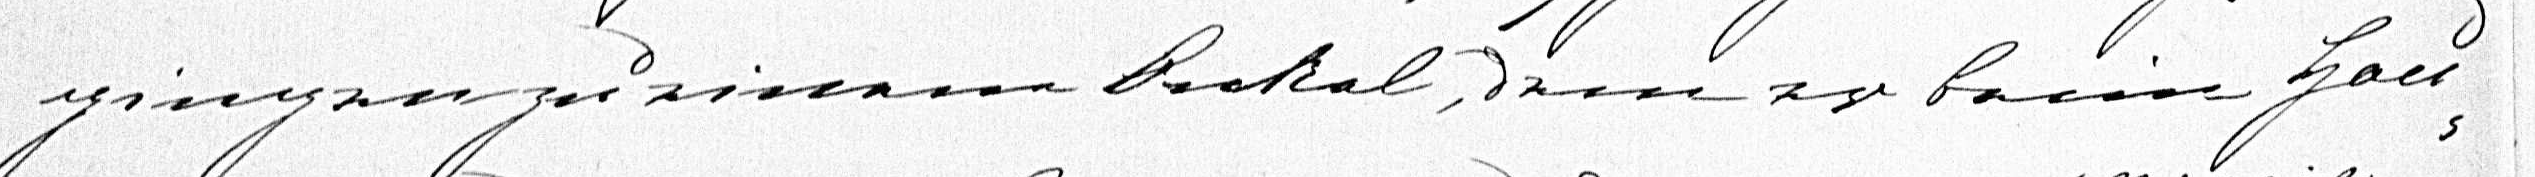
gingen zu einem Beckel, dem er beim Hau¬
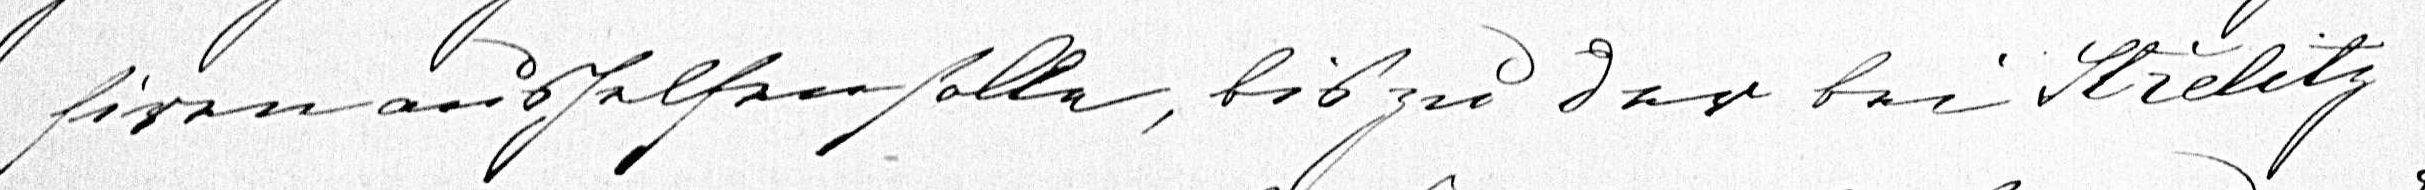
siren aushelfen solle, bis zu der bei Stielitz
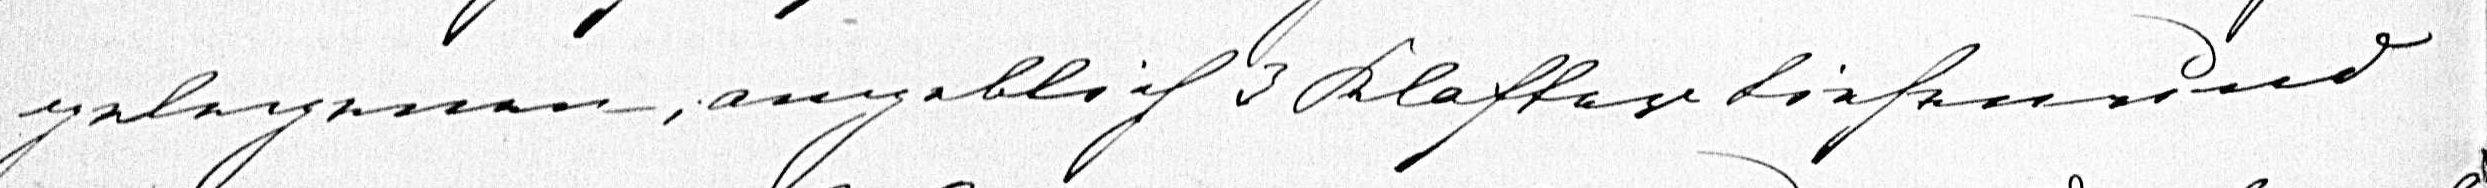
gelegenen, angeblich 3 Klafter biehen und
